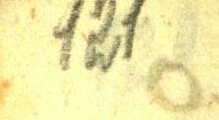121
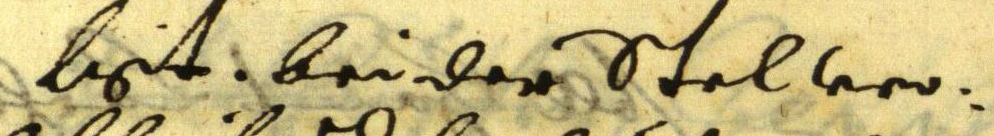ligt. bei der Stel ver¬
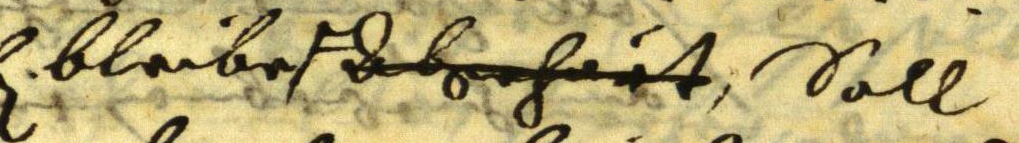bleibe Abgehōrt, Soll
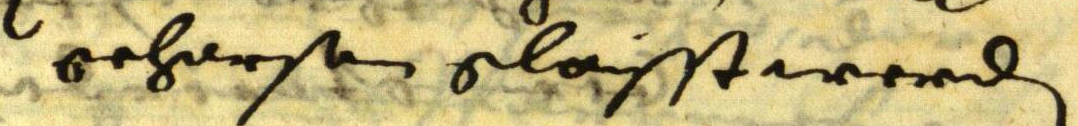gehorsam glaisst werd.
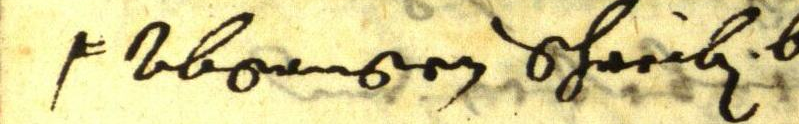Abgangen Schreib.
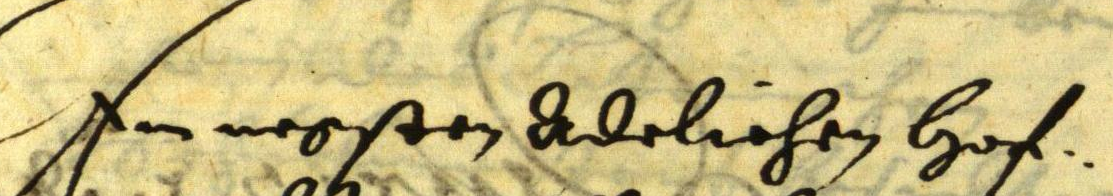Im negsten Adelichen Hof¬
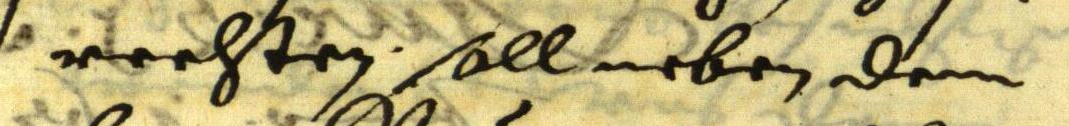rechten. soll neben dem
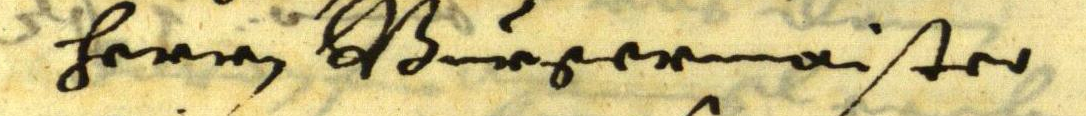herrn Būrgermaister
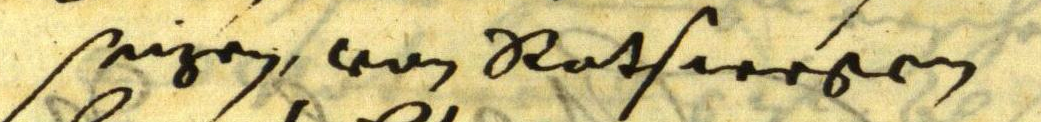sizen von Ratswegen
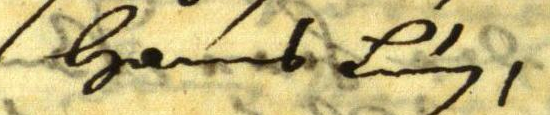Hanns Lūn,
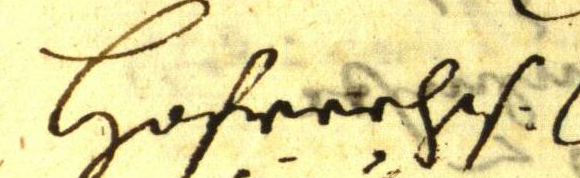Hofrechts¬
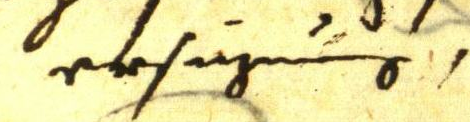ersizūng,
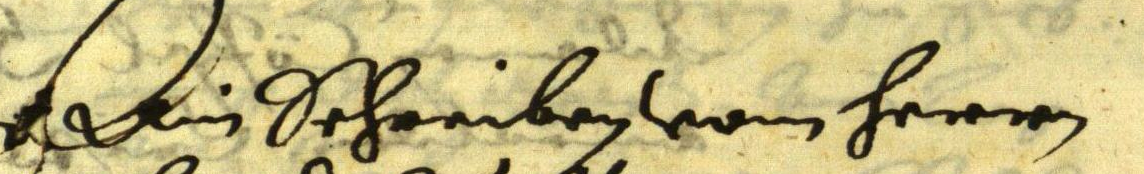Ain Schreiben vom herrn
